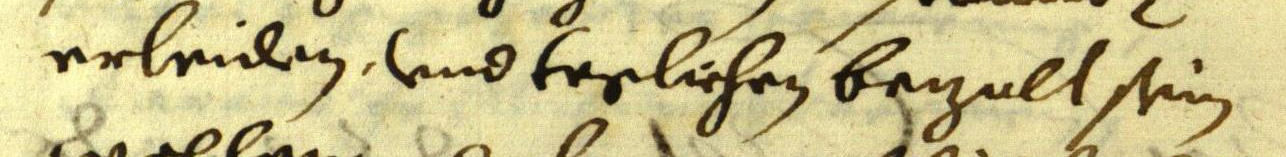erleiden. vnd teglichen bezalt sein
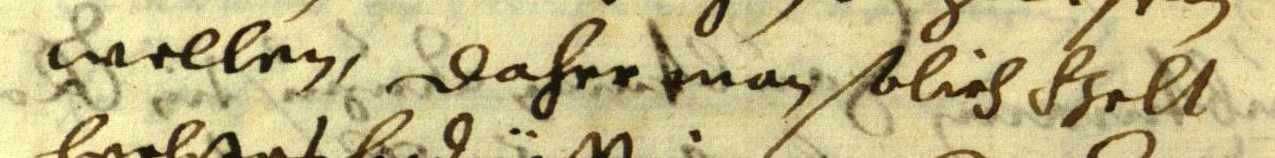wellen, daher man solich Gelt
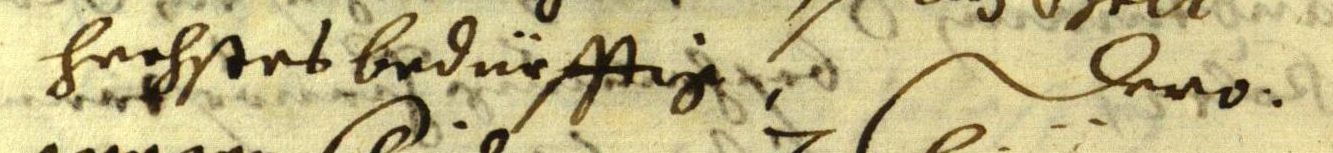hechstes bedürfftig, Dero¬
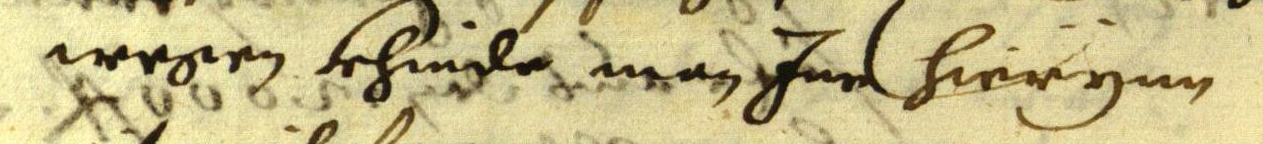wegen khinde man Ine hierÿnn
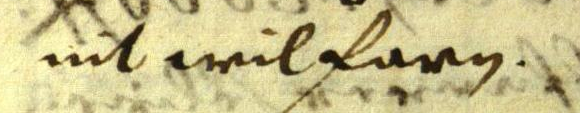nit wilfarn.
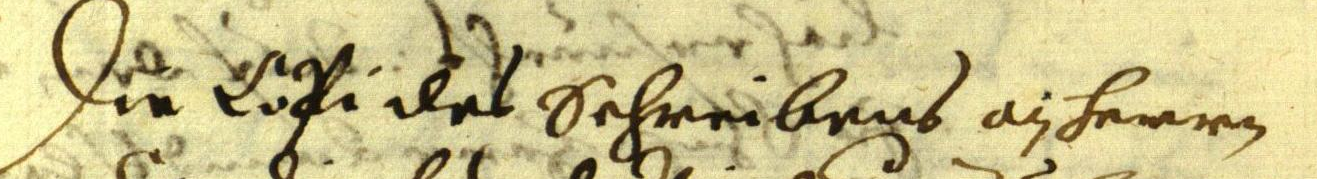Die CoPi des Schreibens an herrn
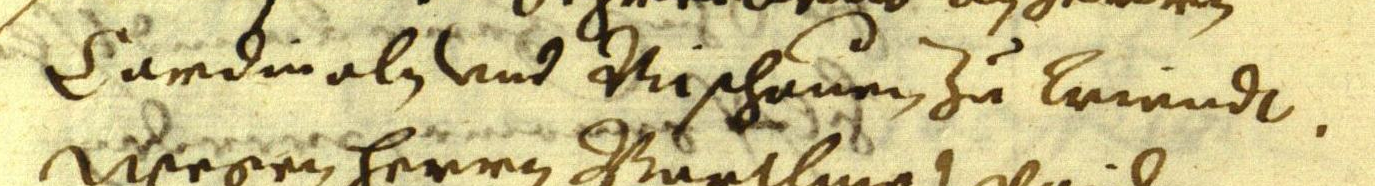Cardinaln vnd Bischoūen Zū Triendt.
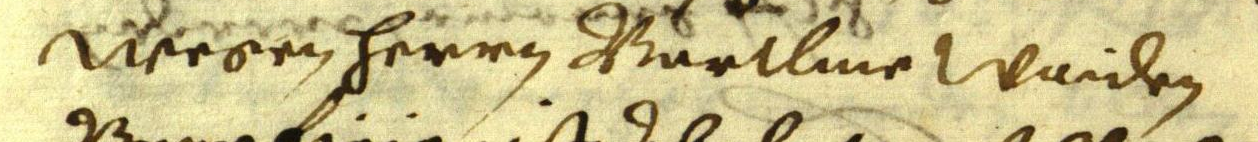Wegen herrn Bartlme Waiden
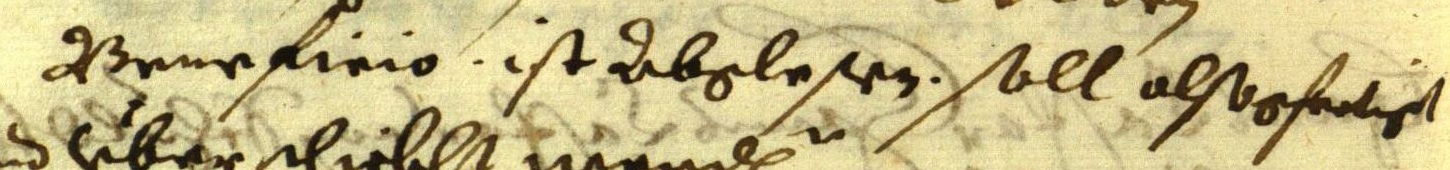Beneficio. ist abglesen. soll also gfertigt
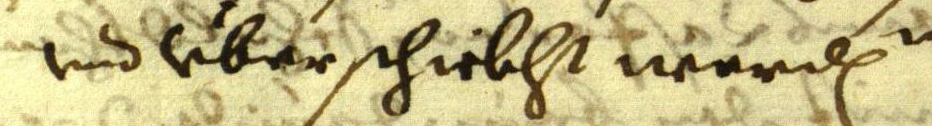vnd v̄ber schickht werd.
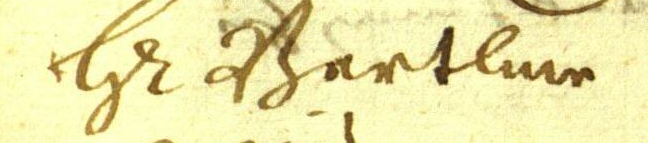H Bartlme
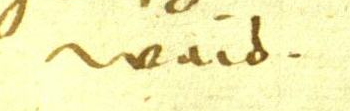Waid.
